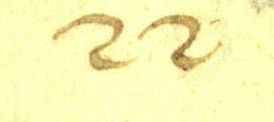22
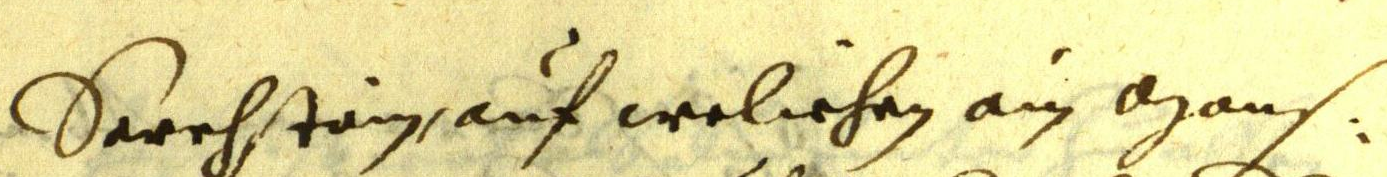Sarchstain, aūf welichen ain Mons¬
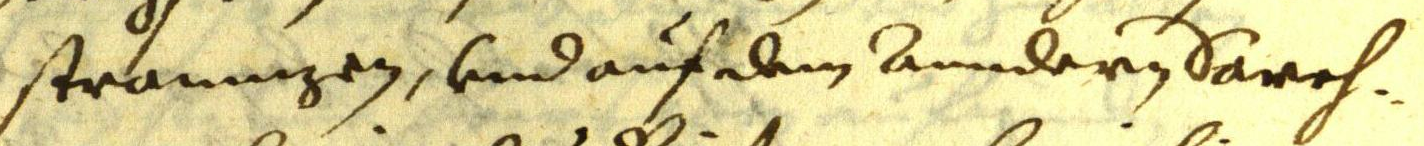strannzen, vnd aūf dem Anndern Sarch¬
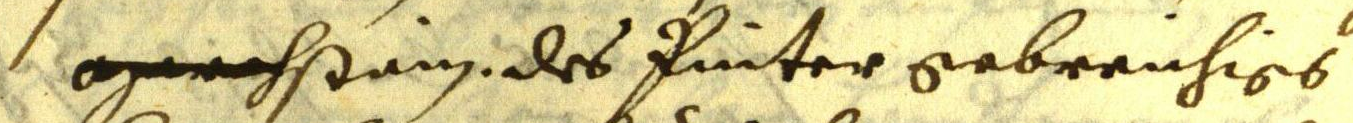March stain. des Pinter gebreichigs
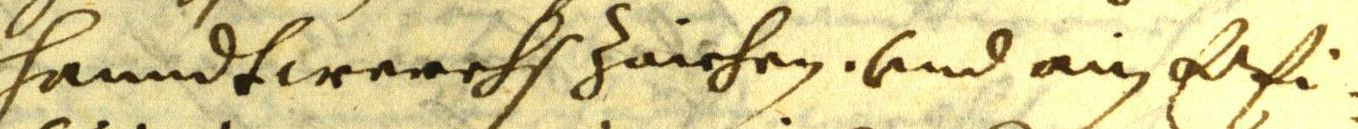Hanndtwerckhs Zaichen. vnd ain Epi¬
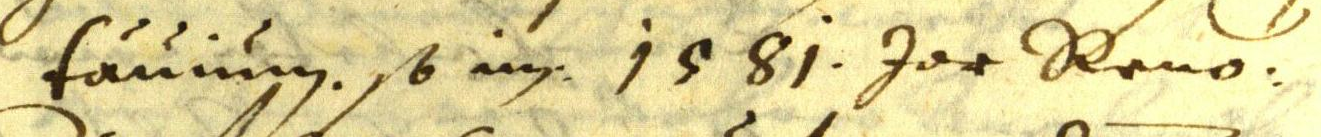tāūiūm. so im: 1581. Jar Reno¬
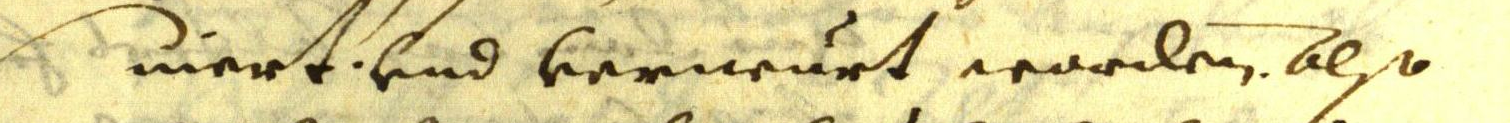viert. vnd verneūrt worden. Also
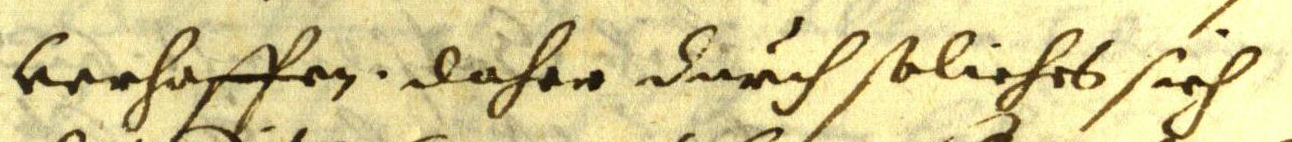verhoffen. daher dūrch soliches sich
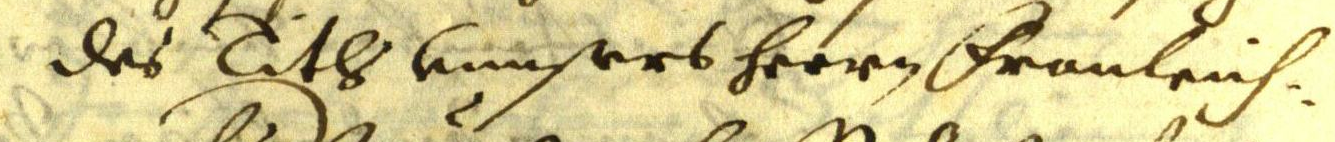des Titls vnnsers herrn Fronleich¬
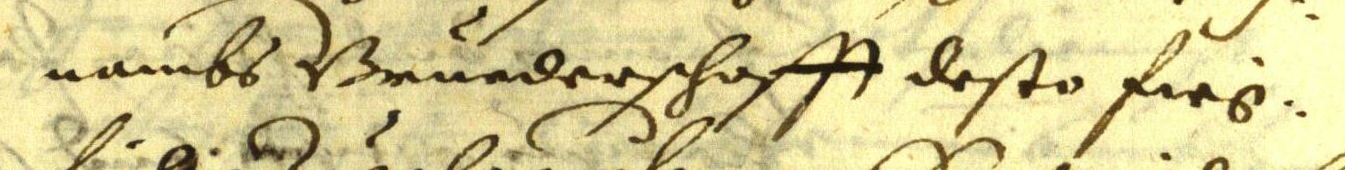nambs Brūederschafft desto fieg¬
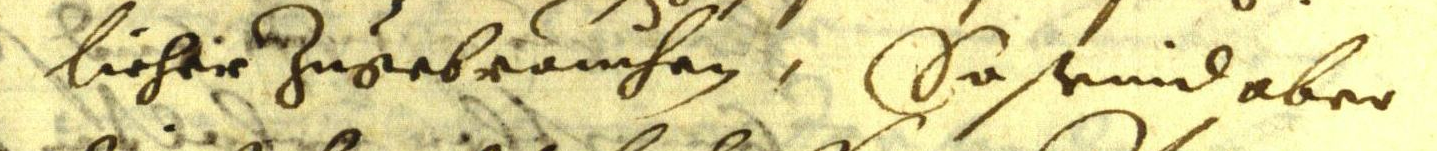licher Zūgebraūchen, So sind aber
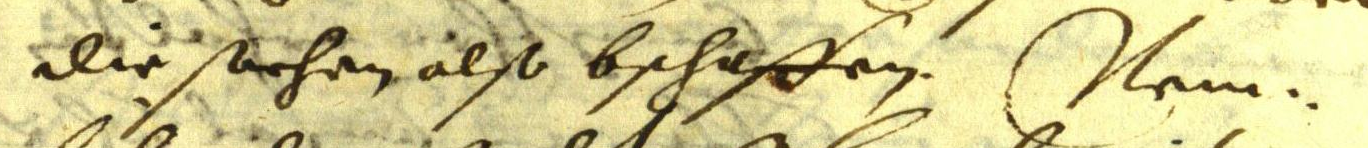die sachen also beschaffen. Nem¬
